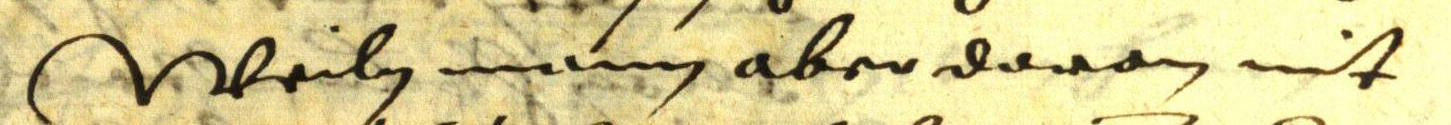Weiln mann aber daran nit
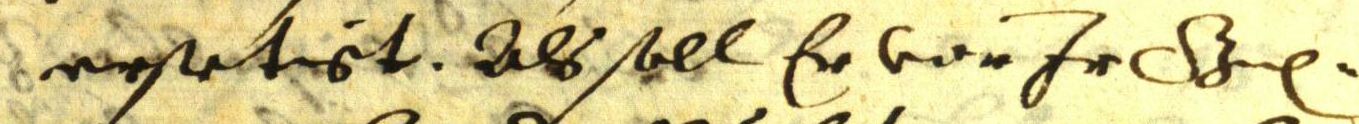Ersetigt. Als soll Er vor Ir Gn:
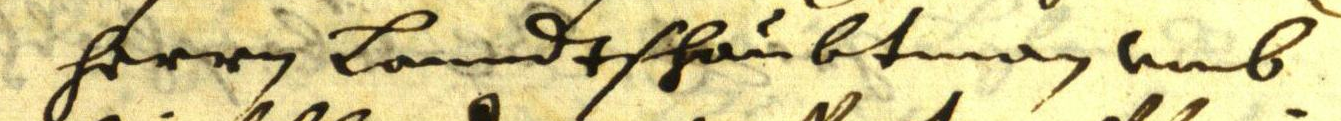Herrn Landtshaūbtman vmb
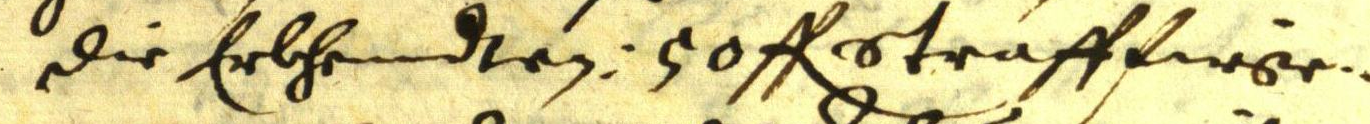die Erkhenndten: 50 fl Straff firge¬
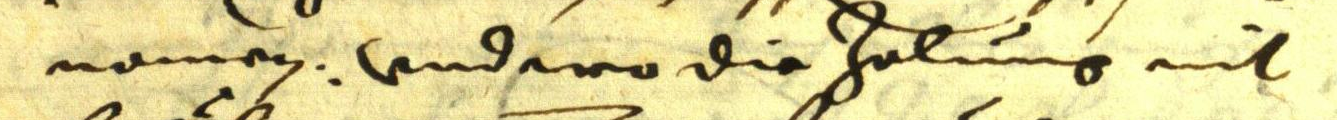nomen: vnd wo die Zalūng nit
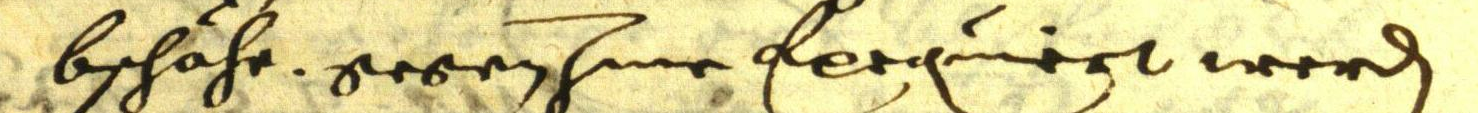bschōhe. gegen Ime Exeqūiert werd.
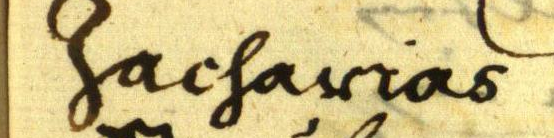Zacharias
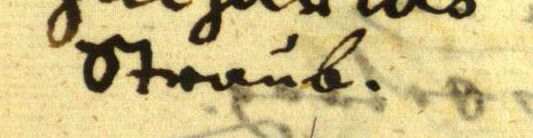Straūb.
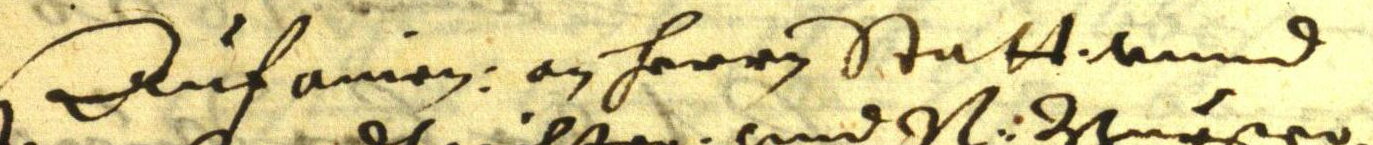Aūf ainen: an herrn Statt. vnnd
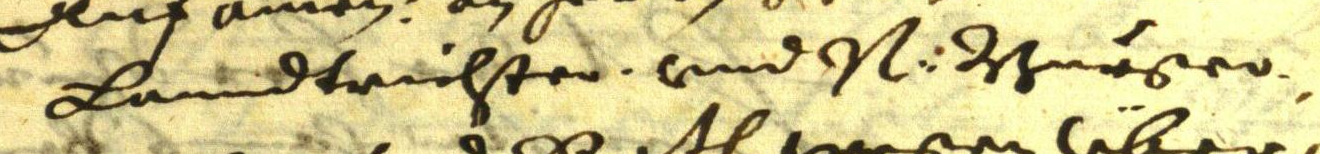Lanndtrichter. vnd N. Būrger¬
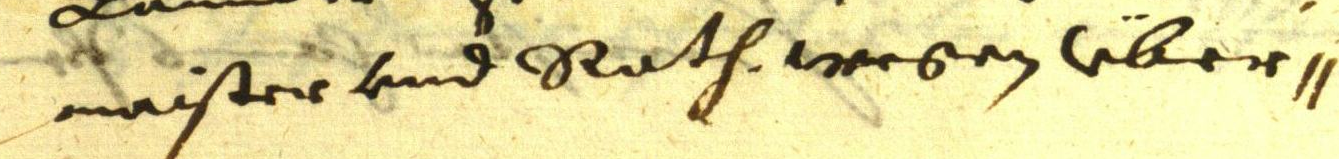maister vnd Rath. wegen v̈ber¬
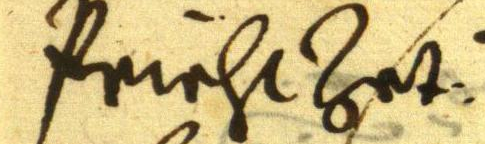Peicht Zet¬
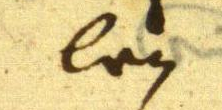len
